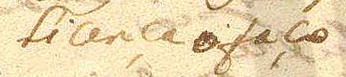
licença o faço
